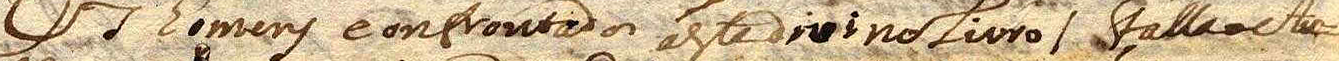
Os homens confrontados a este divino Livro / Falla o Au
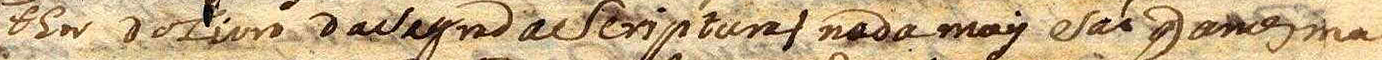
thor do Livro da segnda Scriptura / nada mais saõ q̄ a mesma
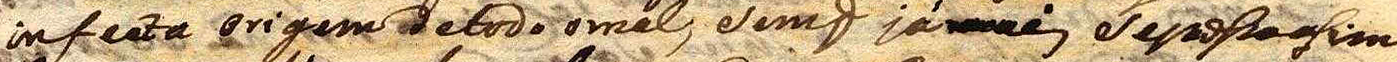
infecta origem de todo o mal, sem q̄ já __is se possa assim
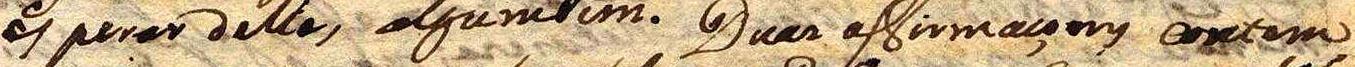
esperar della, algum bem. Duas affirmaçoens contem
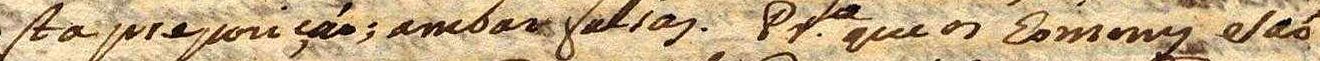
esta prepoziçaõ; ambaz falsas. Pr.a que os homems saõ
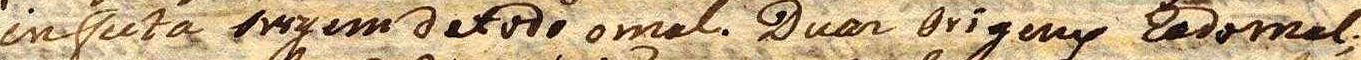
infecta origem de todo o mal. Duaz origens ha do mal;
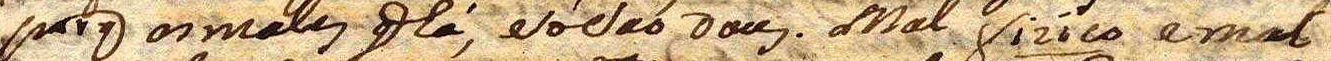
porq̄ os males q̄ há, só saõ dous. Mal fizíco e mal
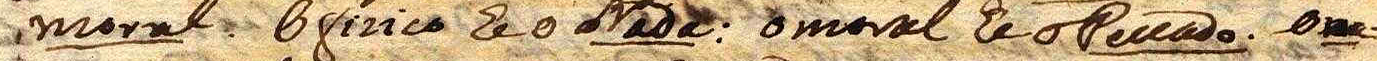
moral. O fizico he o Nada: o moral he o Peccado. o na
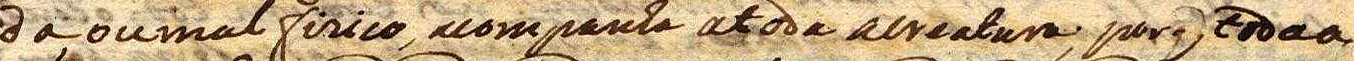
da, ou mal fizico, acompanha a toda a creatura; porq̄ toda a
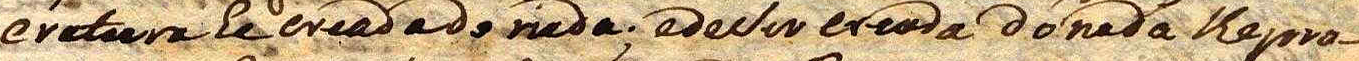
cretura he creada do nada; e de ser creada do nada lhe pro
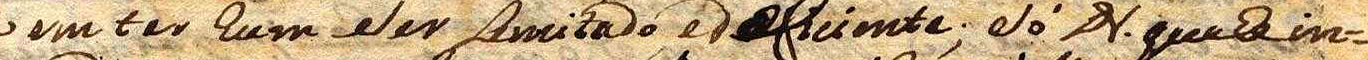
vem ter hum ser Lemitado, e d_ficiente; só Ds. que he in
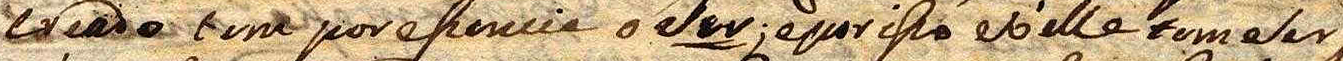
creado tem por essencia o ser; e por isso só elle tem ser
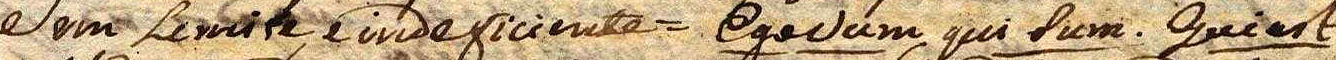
sem Lemite, e indeficiente = Ego sum, qui sum. Qui est
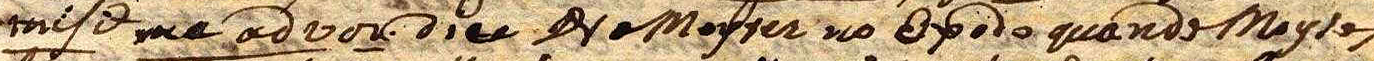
misit me ad voz. dice Ds a Moysez no Exodo quando Moyses
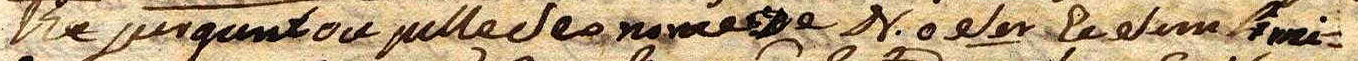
lhe perguntou pelle seo nome de Ds. o ser he sem Limi
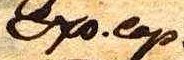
Exo. cap.
